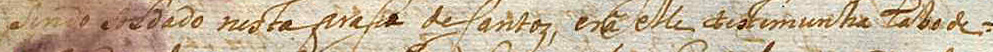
sendo soldado nesta prassa de santos, era elle testimunha cabo de
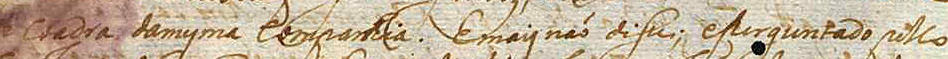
Coadra da mesma Companhia. E mais naõ disse; e perguntado pello
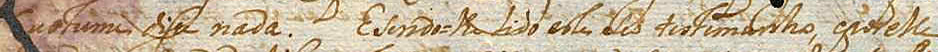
ustume disse nada. E sendo-lhe lido este seo testemunho, e por elle
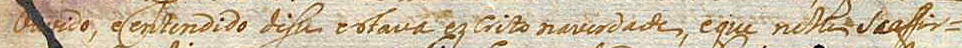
ouvido, e entendido disse estava escrito na verdade, e que nelle se affir
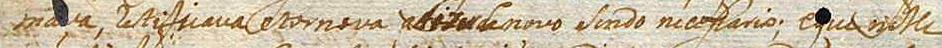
mava, Ratificaua e tornava a dizer de novo sendo necessario; e que nelle
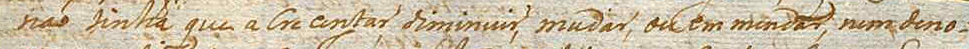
não tinha que aCrecentar, diminuir, mudar, ou emmendar, nem de no
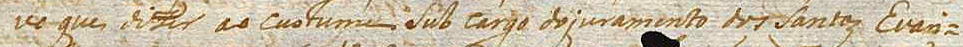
vo que dizer ao custume sub cargo do juramento dos Santos Evan
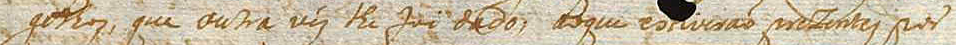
gelhos, que outra vés lhe foi dado, ao que estiueraõ prezentes por
